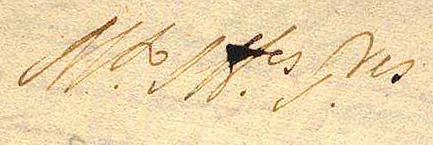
M.to Ill.es S.res
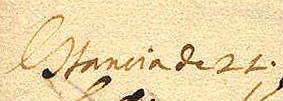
Estancia de 21.
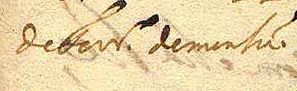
de Fevr.o de manhã.
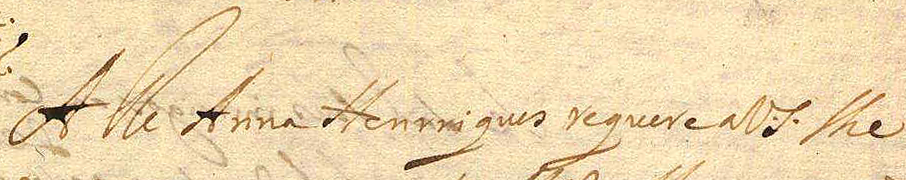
A Re Anna Henrriques requere a V S. lhe
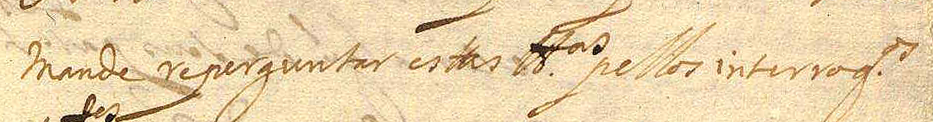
mande reperguntar estas tt.as pellos interrog.os
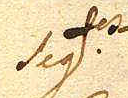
seg.tes
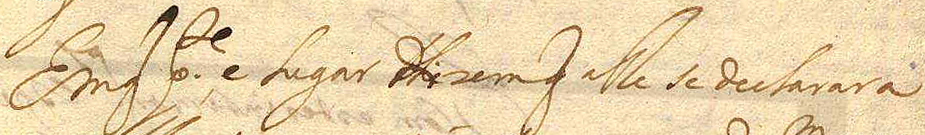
Em q̄ p.te e lugar dizem q̄ a Re se declarara
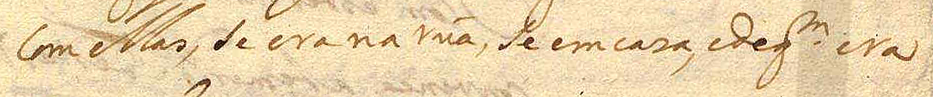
com ellas, se era na rua, se em caza, e de q.m era
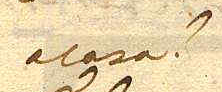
a caza?
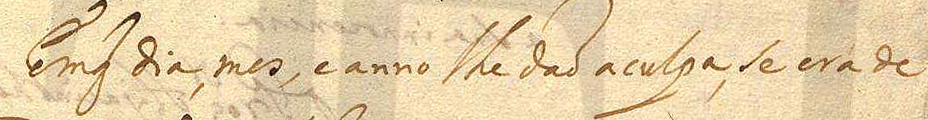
Em q̄ dia, mes, e anno lhe daõ a culpa, se era de
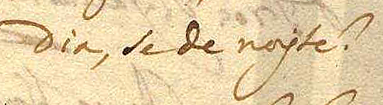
dia, se de noyte?
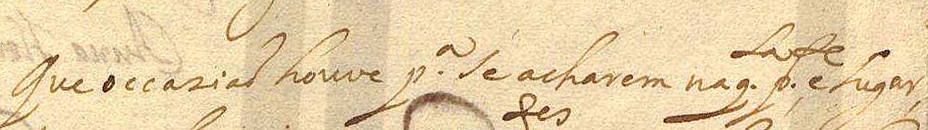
Que occaziaõ houve p.a se acharem naq.La p.te, e lugar,
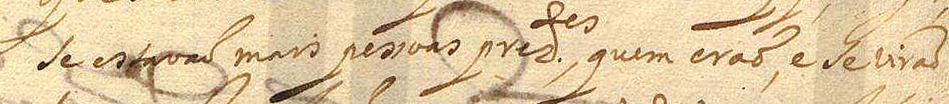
se estavaõ mais pessoas prez.te, quem eraõ, e se viraõ
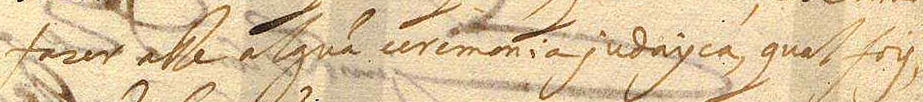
fazer a Re alguā ceremonia judayca, qual foy,
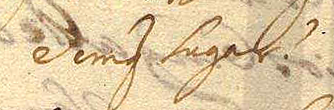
e em q̄ lugar?
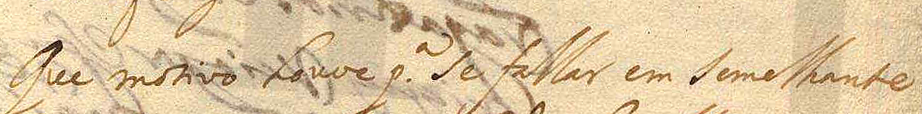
Que motivo houve p.a se fallar em semelhante
